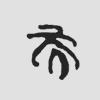而
